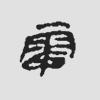雺
